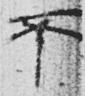不
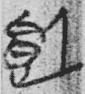飤（食）
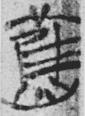舊
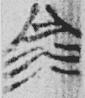汬
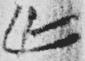亡（无）
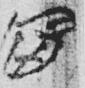○（禽）
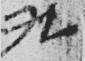九
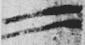二
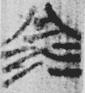汬
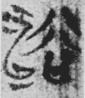浴（谷）
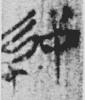矤（射）
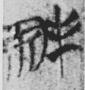○（鮒）
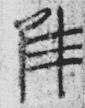佳
